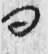日
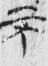不
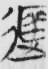𬨭（將）
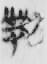○（菐）
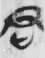君
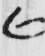㠯（以）
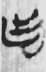○（廷）
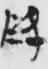阩
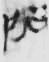門
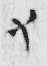又
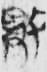敗
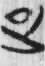疋
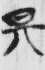○（期）
